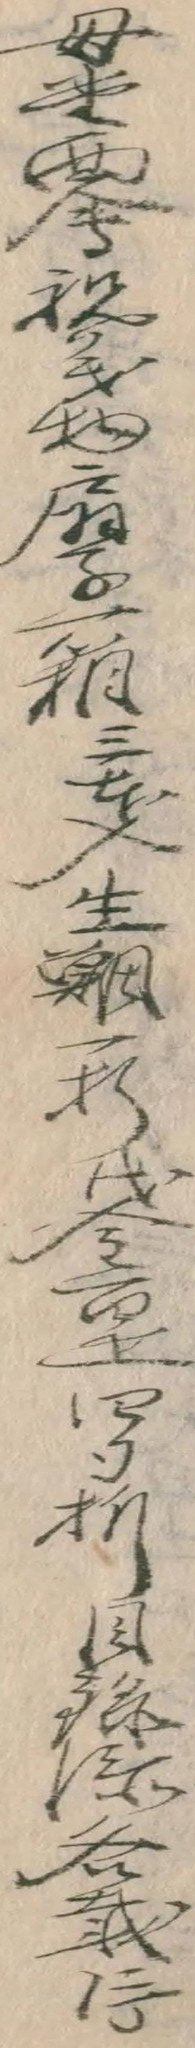母堂面會祝義物扇子一箱三本入生鯛一折代金百疋四ツ折目録添各戴片
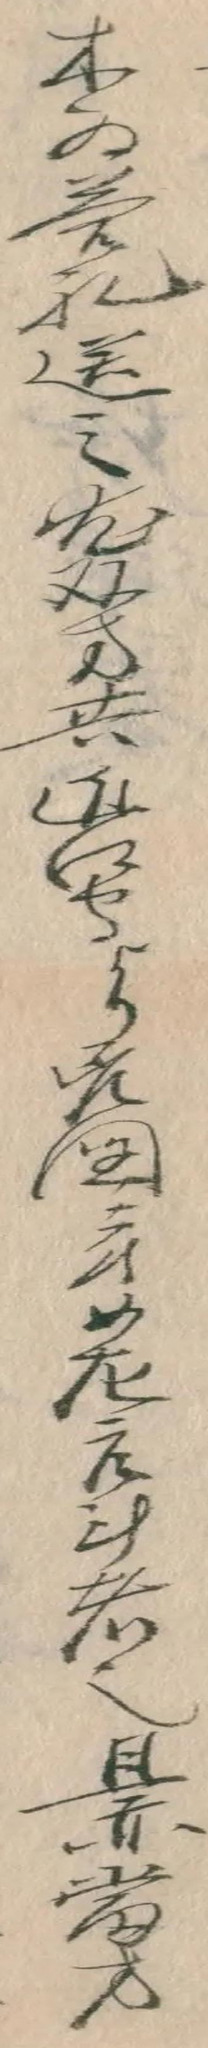木為答礼送之尤双方共近江守より差図ニ付如左乍斗者也且亦當方
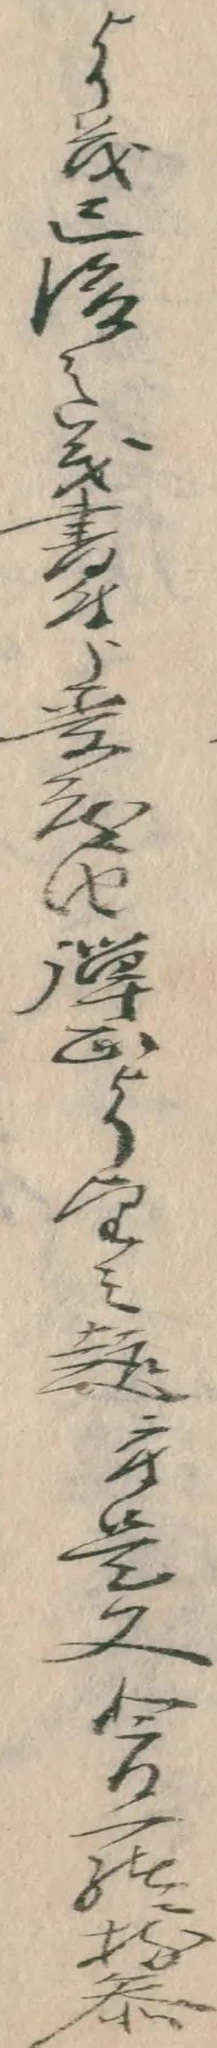よりも已後之義書付被受度由弾正より望ミ趣ニ付是又今日一統持参
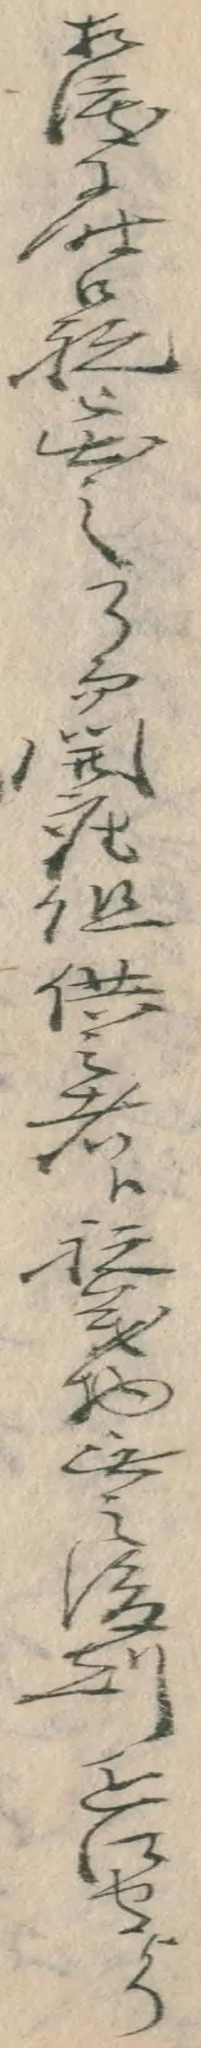相渡于時御祝被出之了而開座但供之者え祝義物無之後刻近江守より
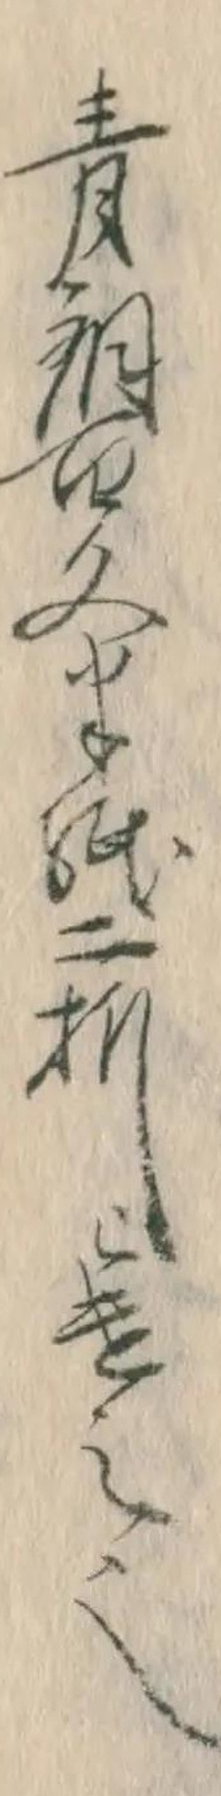青銅四文半紙二折被遣之也
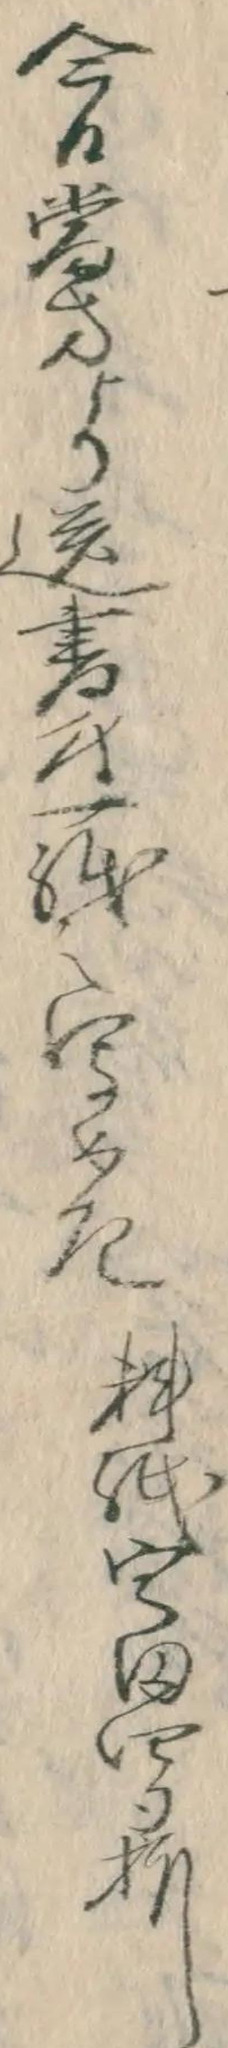今日當方より送書付一紙之写如左料紙宇田四ツ折

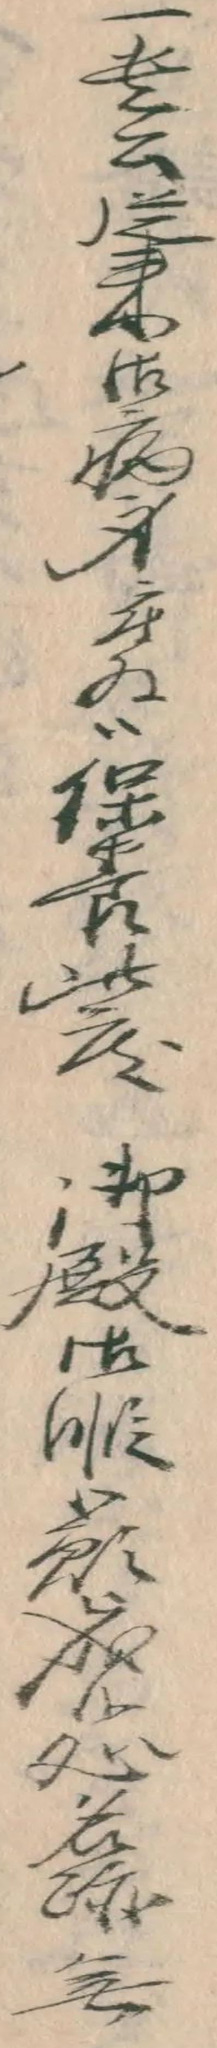一老公従来御病身ニ付為御保養此度御殿御暇御願被成候処名跡無
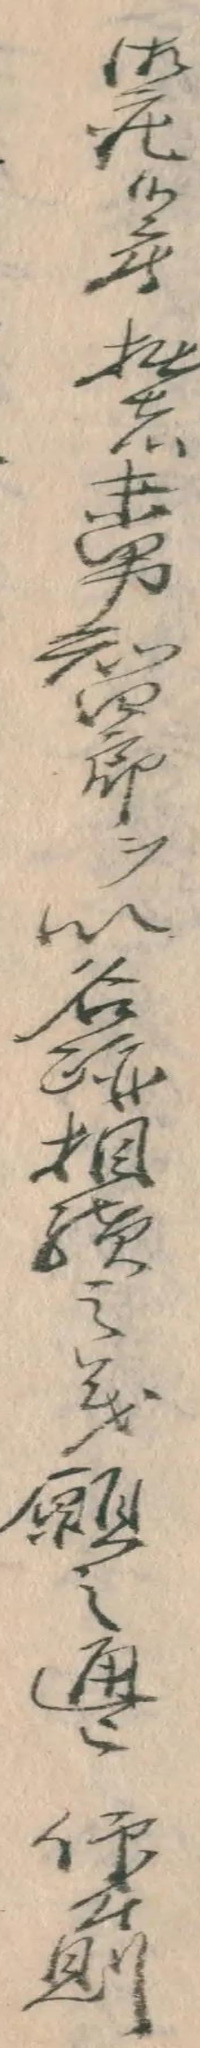御座候ニ付拙者未男知四郎ヲ以名跡相續之義願之通被仰付則
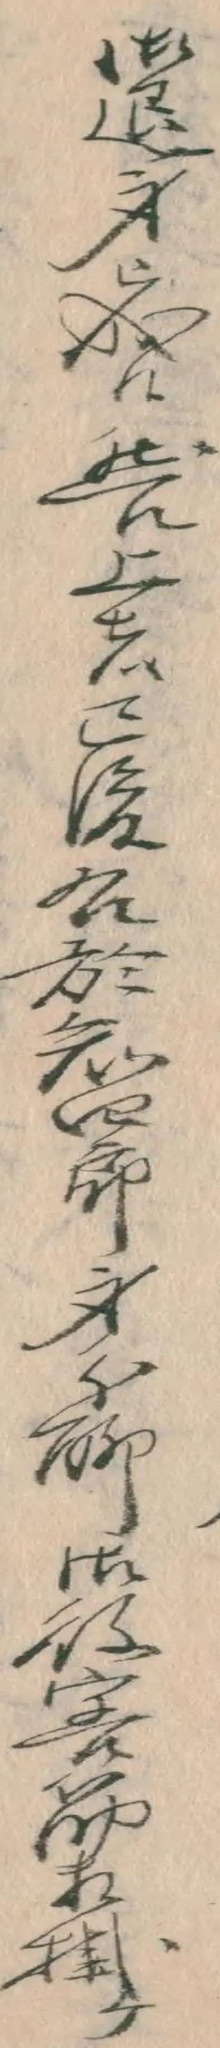御退身被成候然ル上者已後右於知四郎身分聊御役害筋相掛ケ
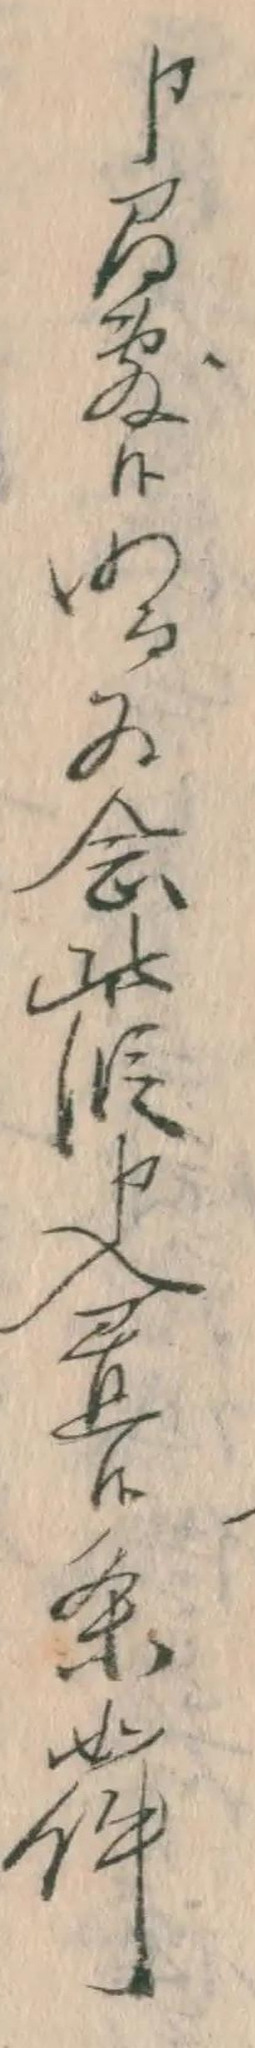申間敷候仍而為念此段申入置候条如件
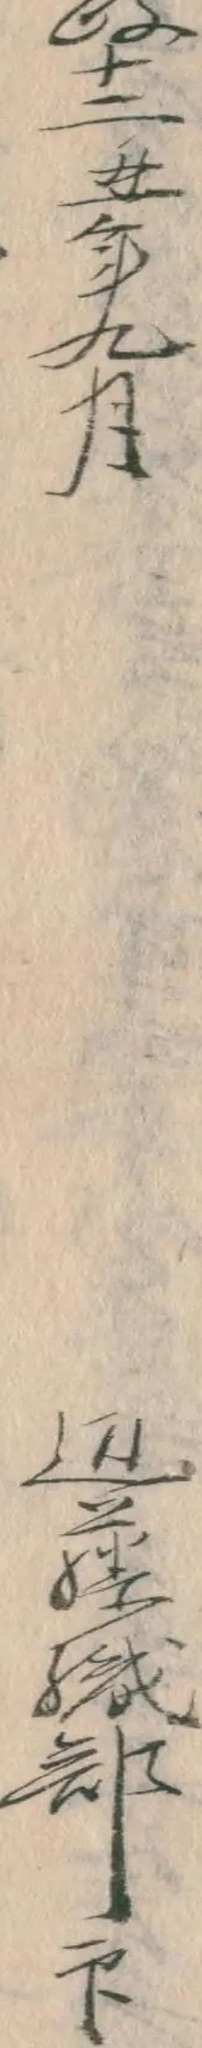文政十二丑年九月近藤織部印
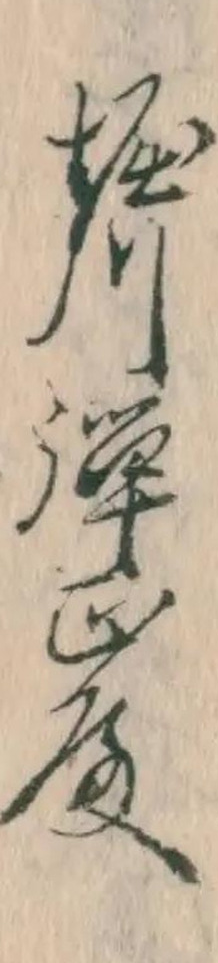堀川弾正殿
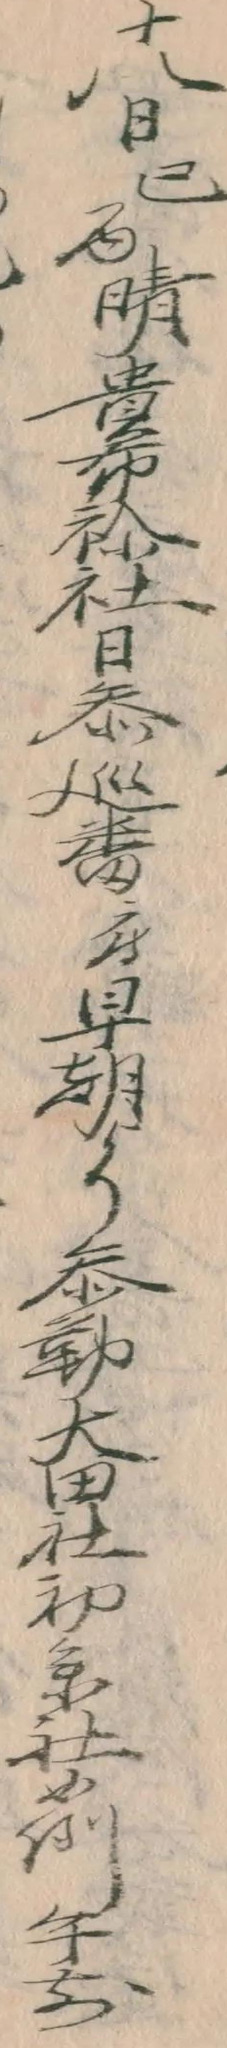十八日己酉貴布祢社日参巡番ニ付早朝より参勤大田仕初参社如例午前
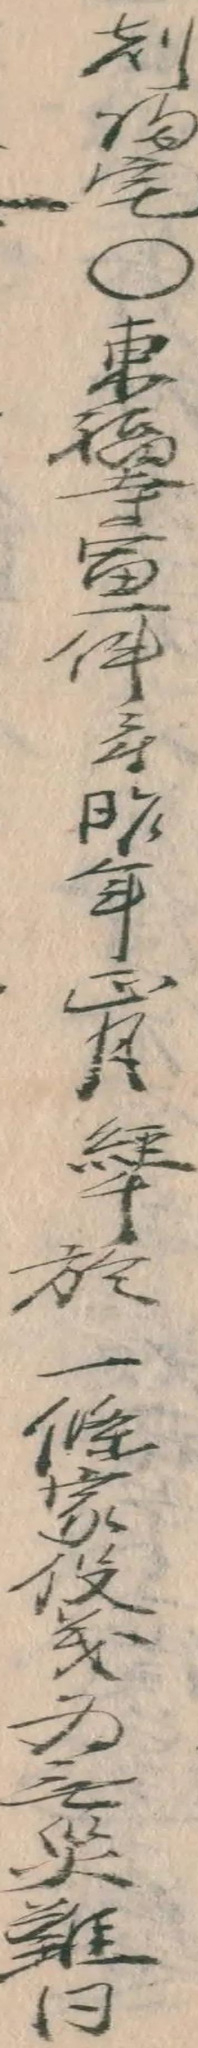刻帰宅○東福寺冨一件ニ付昨年正月経千於一條家役義為無災難同
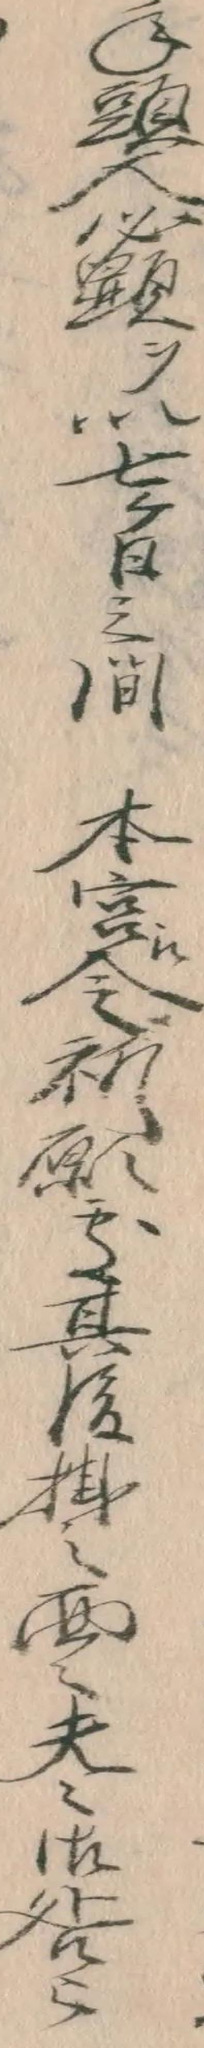年頭人必顕ヲ以七ケ日之間本宮え令祈願處其後掛之面々夫々御咎被
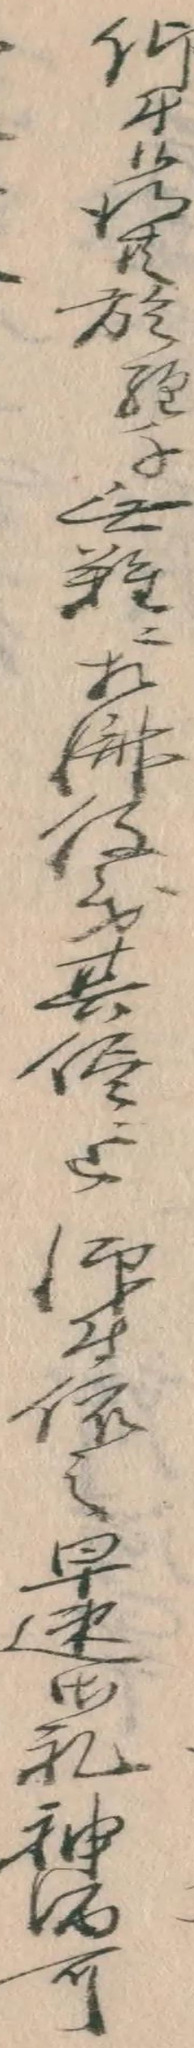仰付候得共於経千無難ニ相済役義其侭ニ被仰付依之早速御礼神酒可
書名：賀茂社記録. 第65冊
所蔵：国立国会図書館 National Diet Library, JAPAN
